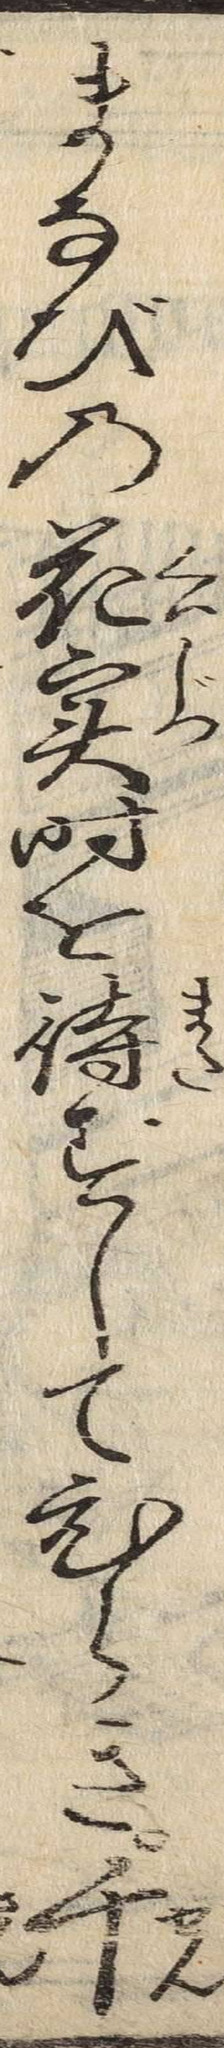まなびの花実時を待すしてひらき。千
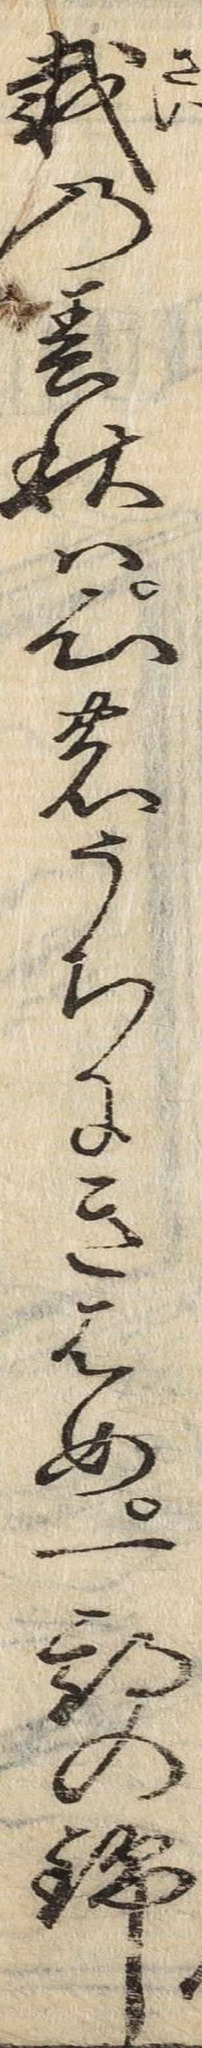載の春秋は。心のうちにきはめ。一部の錦
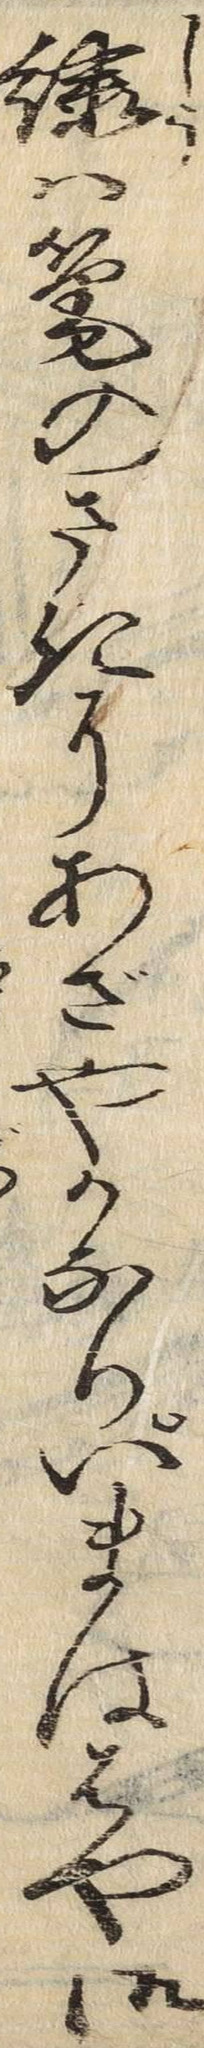繍は筆のさきにあざやかなり。いまははや御
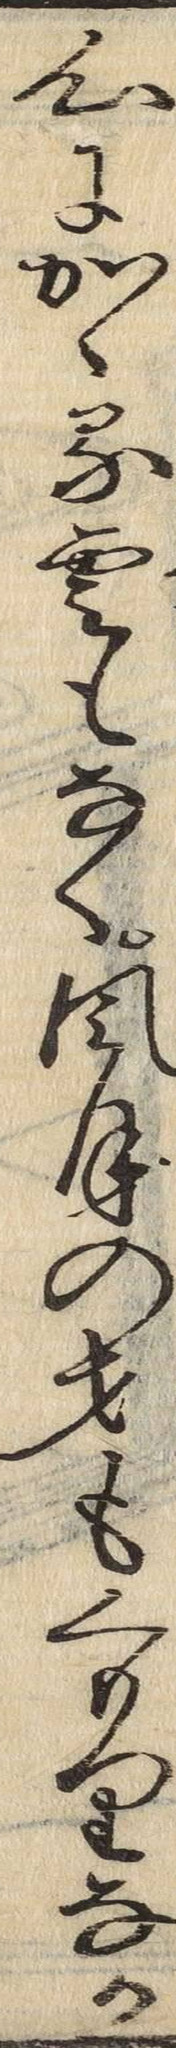心にかゝる雲もなく。風月の才もくもりなか
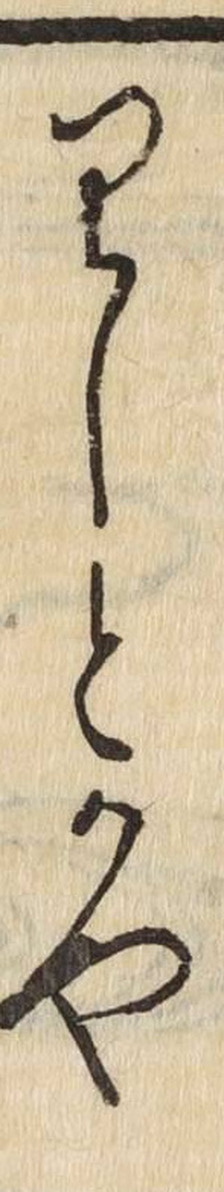りしとかや

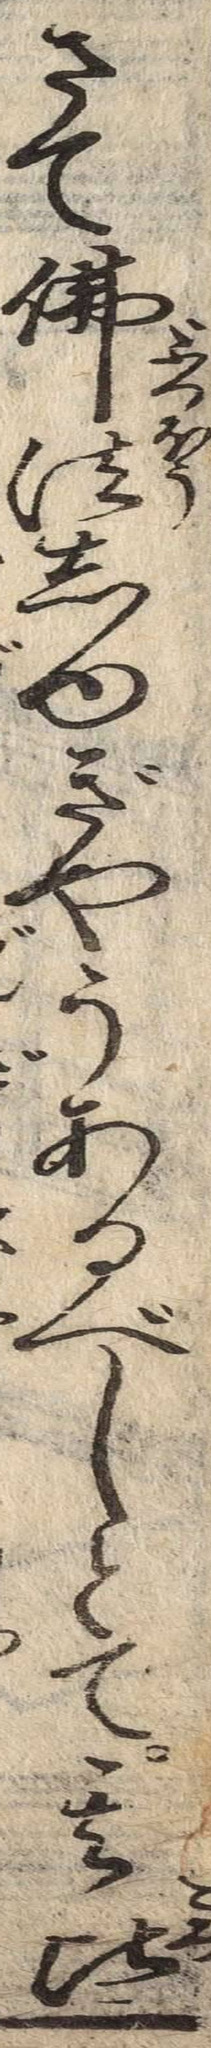さて仏法しゆぎやうあるべしとて。其頃
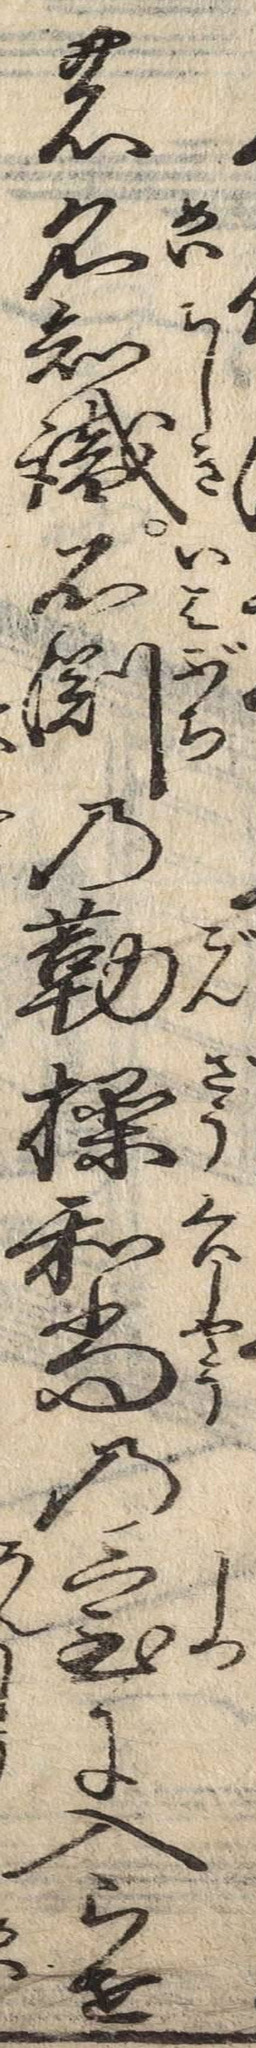の名知識。石渕の権操和尚の室に入らせ
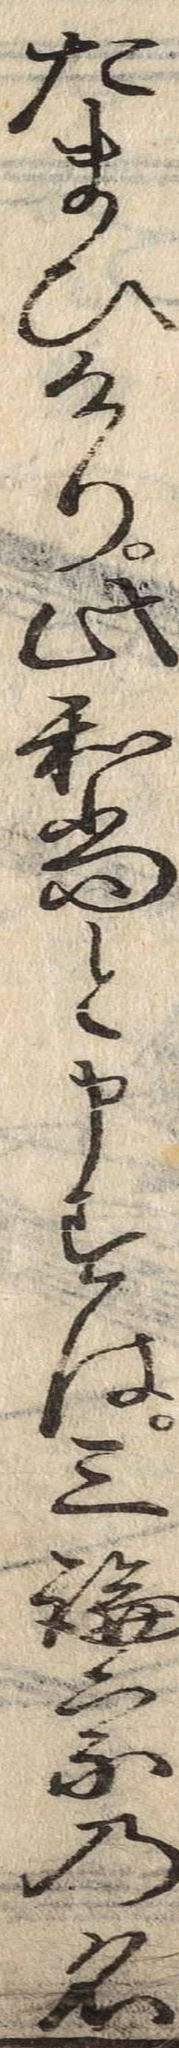たまひけり。此和尚と申すは。三論宗の名
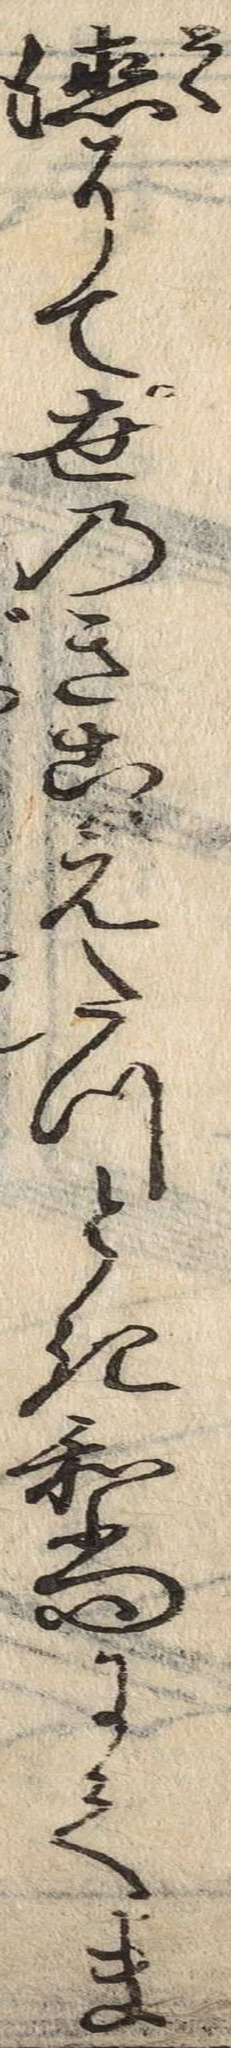徳にて。世のきこえたつとき和尚にてま
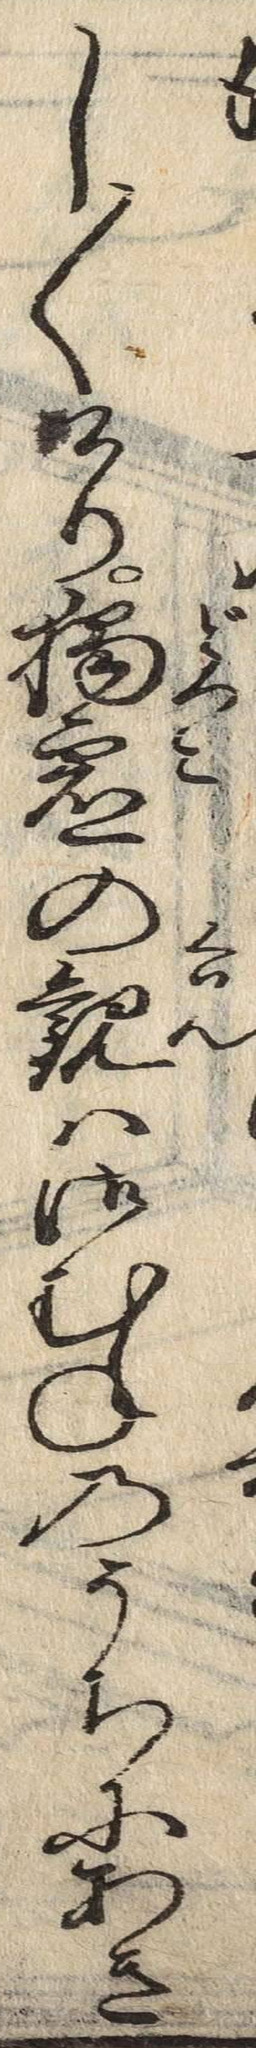し〳〵けり。独虚の観は御むねのうちにあき
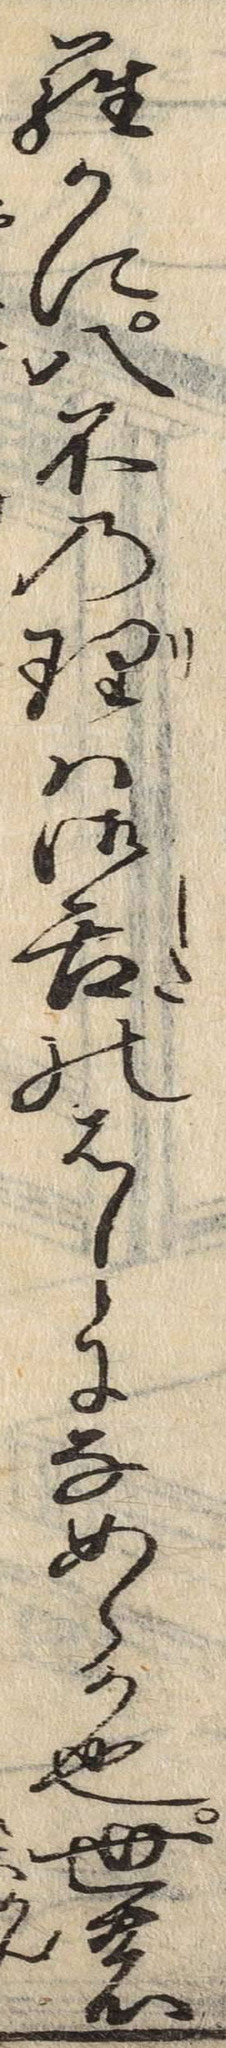らかに。八不の理は御舌のはしになめらか也。世の
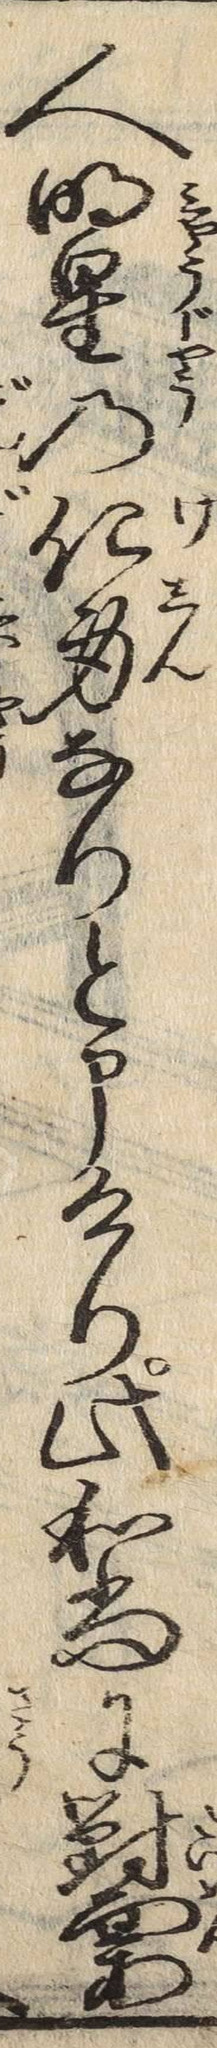人明星の化身なりと。申けり。此和尚に対面あ
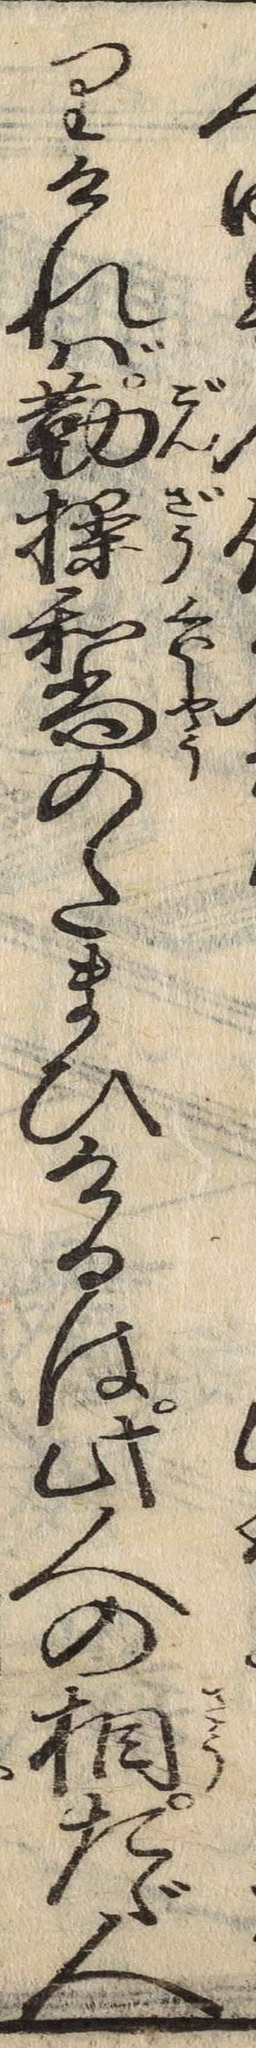りければ権操和尚のたまひけるは。此人の相たゞ人
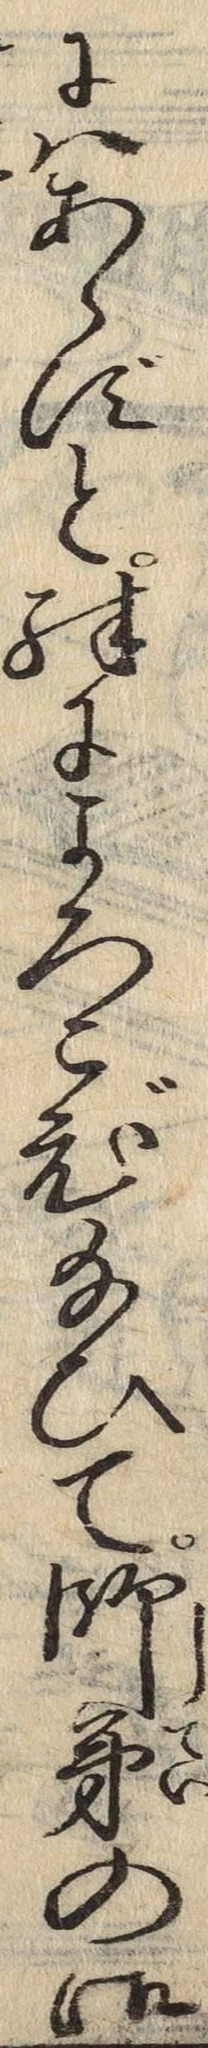にはあらずと。殊によろこび給ひて。師弟の御

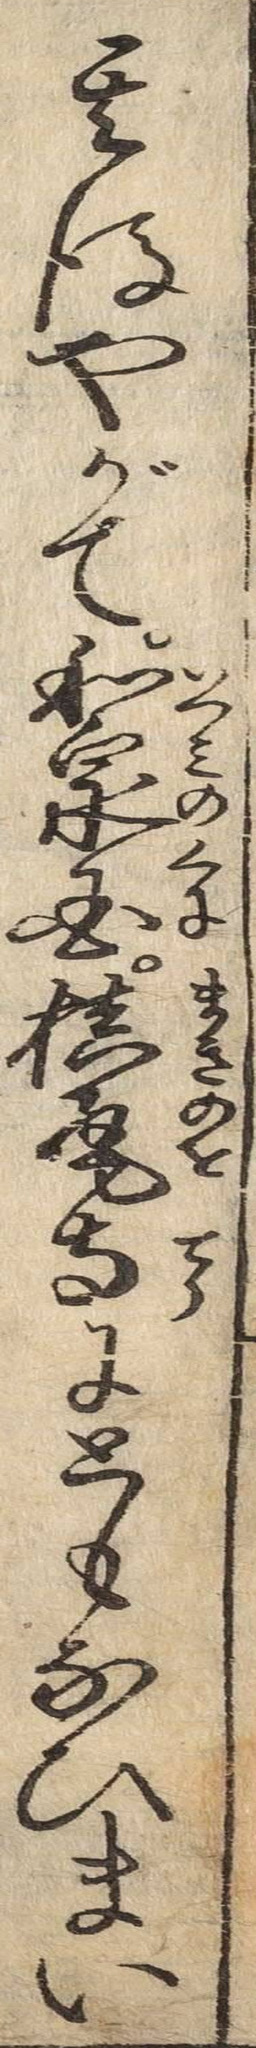其後やがて。和泉国。槙尾寺にともなひまい
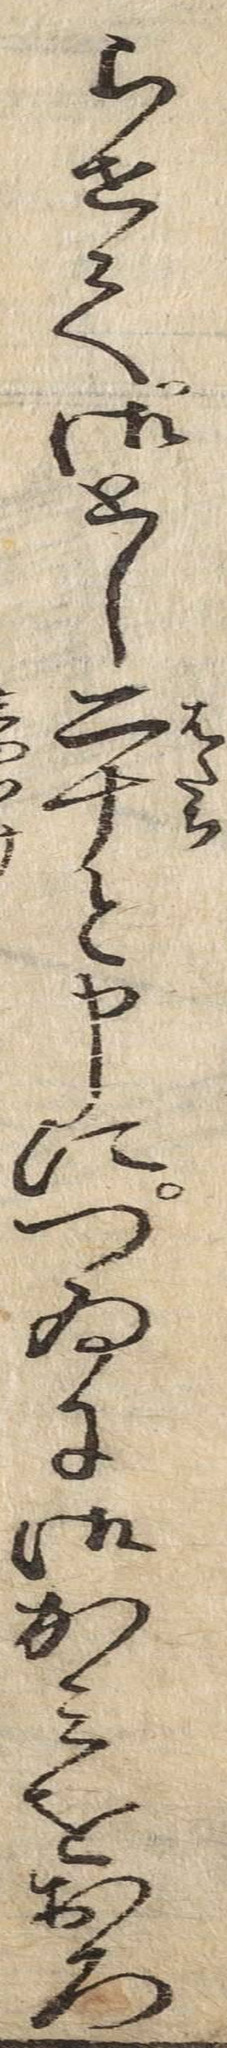らせて。御とし二十と申に。つゐに御かみをおろ
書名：弘法大師御傳記
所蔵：京都府立京都学・歴彩館 国文学研究資料館
